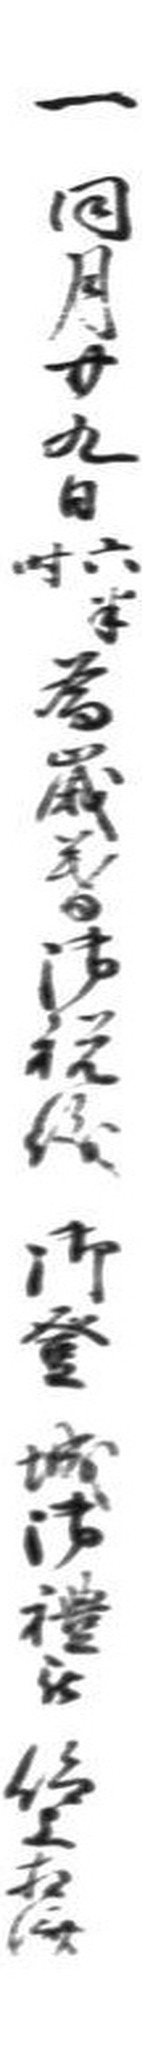一同月廿九日六半時為歳暮御祝儀御登城御礼被仰上相済
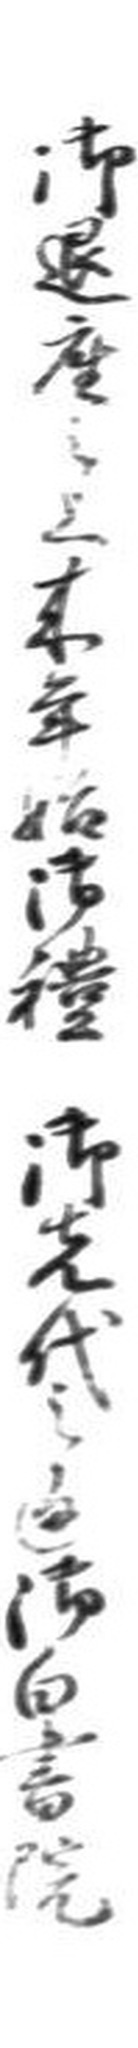御退座之上来年始御礼御先代之通御白書院
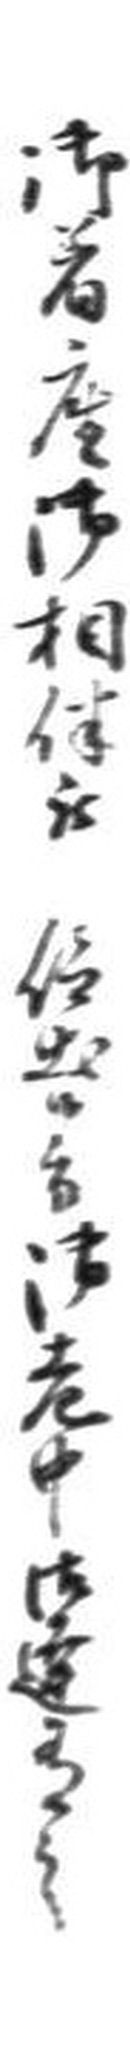御着座御相伴被仰出候旨御老中御達有之
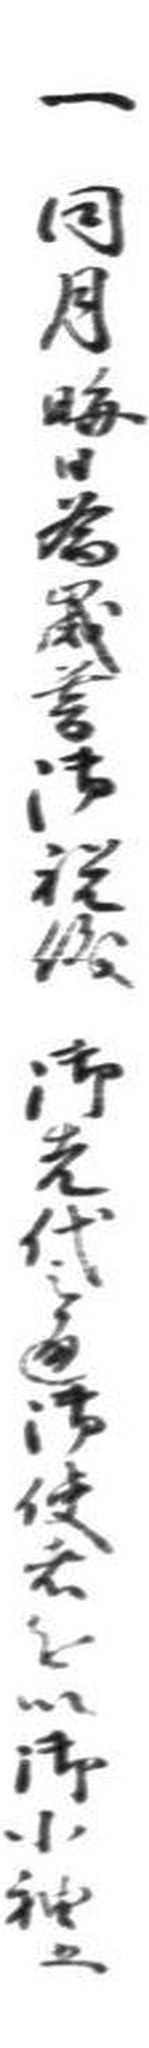一同月晦日為歳暮御祝儀御先代之通御使者を以御小袖五

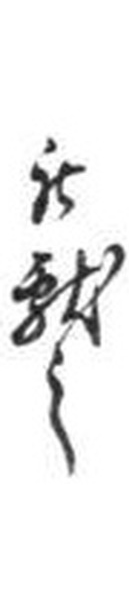被献之
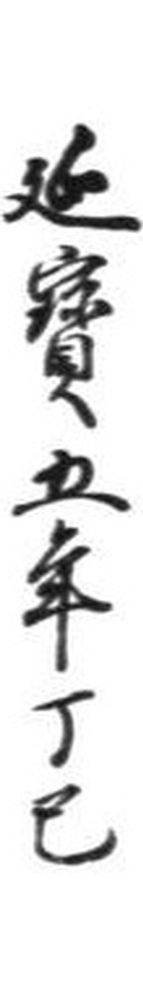延宝五年丁巳
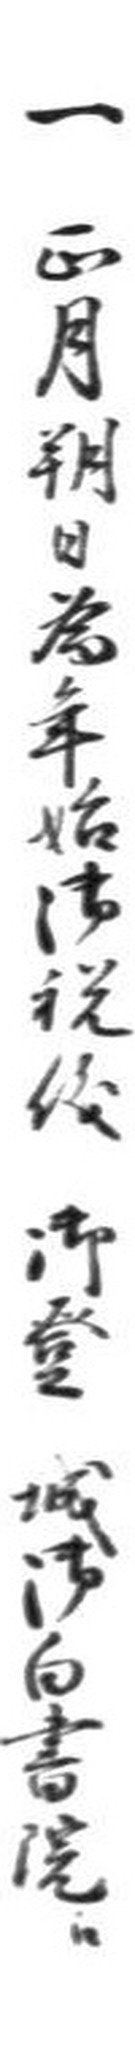一正月朔日為年始御祝儀御登城御白書院江
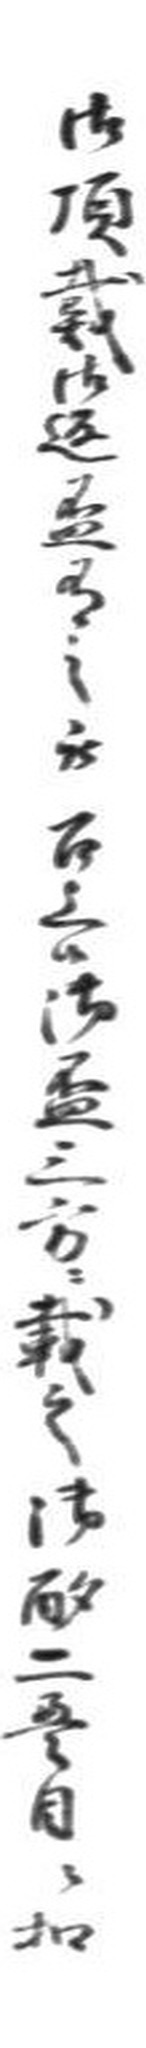御頂戴御返盃有之被召上候御盃三方ニ載之御酌二畳目ニ
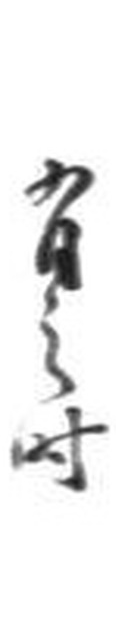有之時
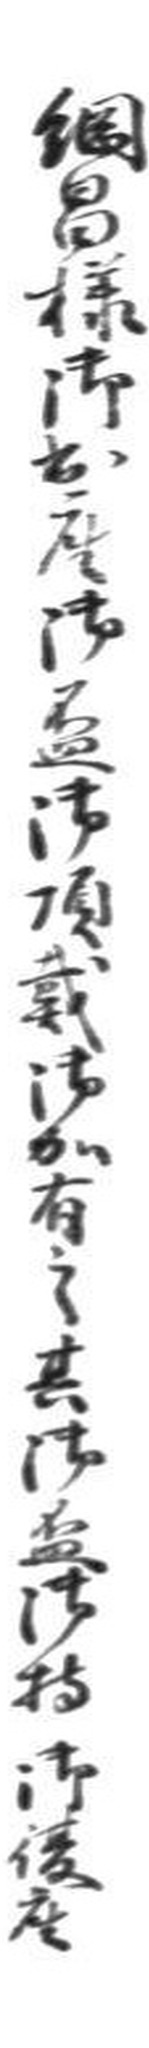綱昌様御出座御盃御頂戴御加有之其御盃御持御復座

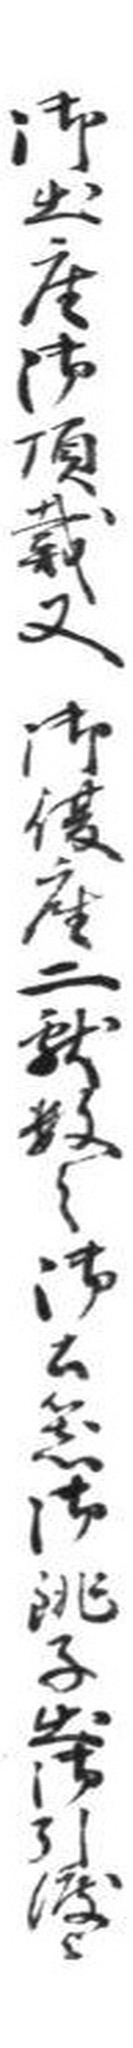御出座御頂戴又御復座二献数之御土器御銚子出御引渡と
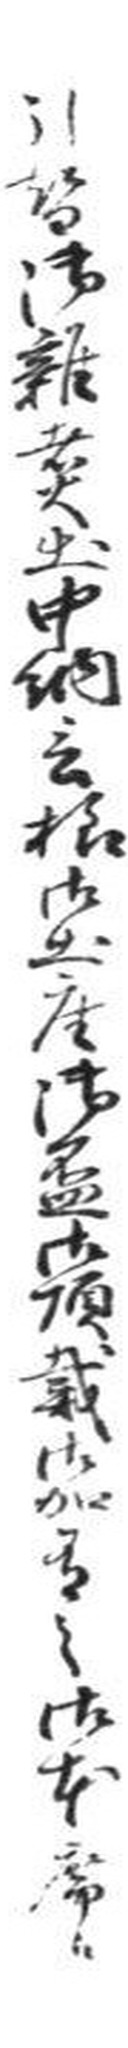引替御雑煮出中納言様御出座御盃御頂戴御加有之御本席江
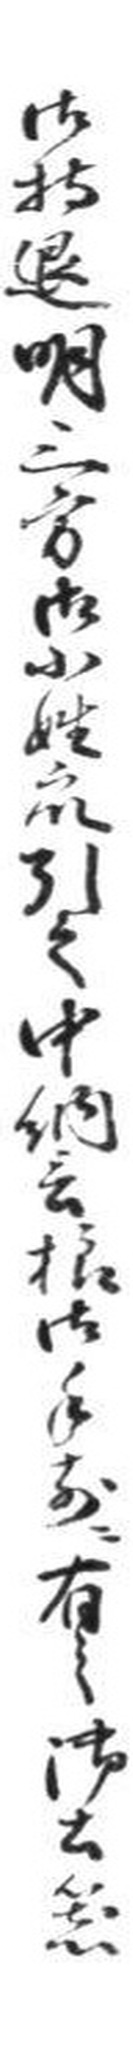御持退明三方御小姓衆引之中納言様御手前ニ有之御土器
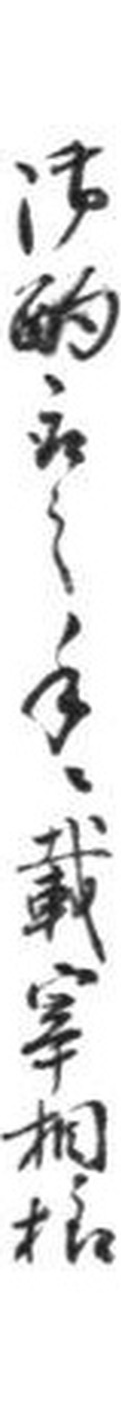御酌取之手ニ載宰相様
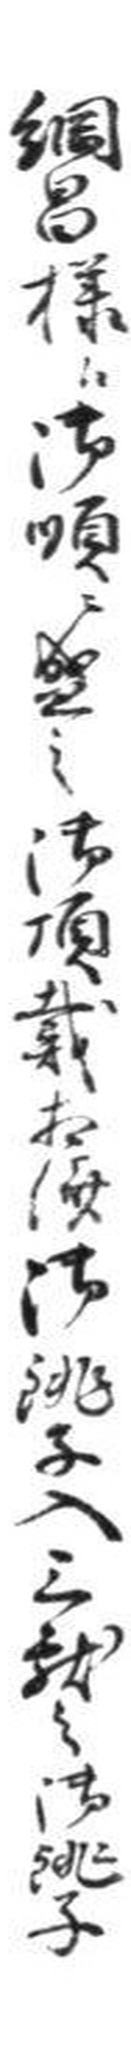綱昌様江御順ニ盛之御頂戴相済御銚子入三献之御銚子
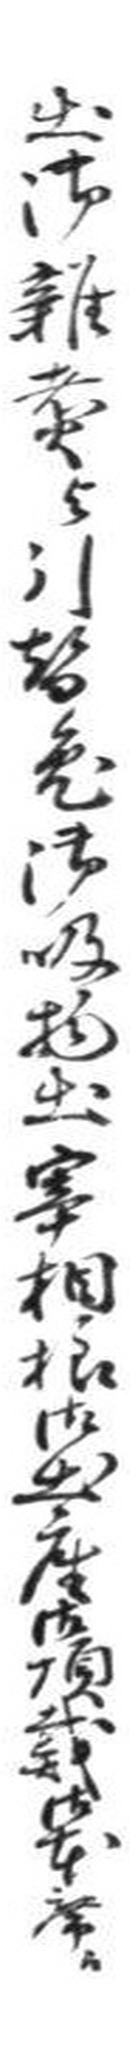出御雑煮と引替兎御吸物出宰相様御出座御頂戴御本席江
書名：家譜 十三 綱昌公 従寛文元年到延宝五年
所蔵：福井県文書館 Fukui Prefectural Archives
